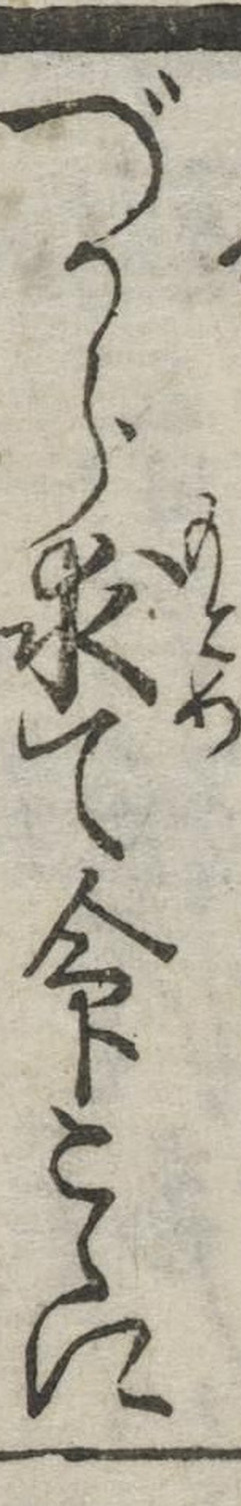づから求て命こゝに
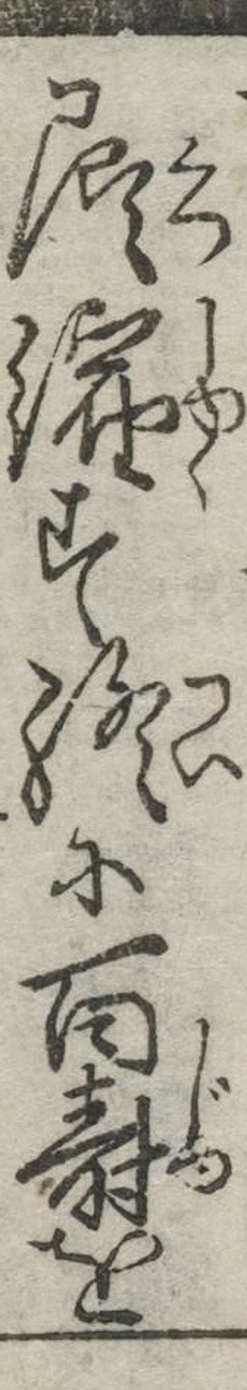屈縮す終に百壽を
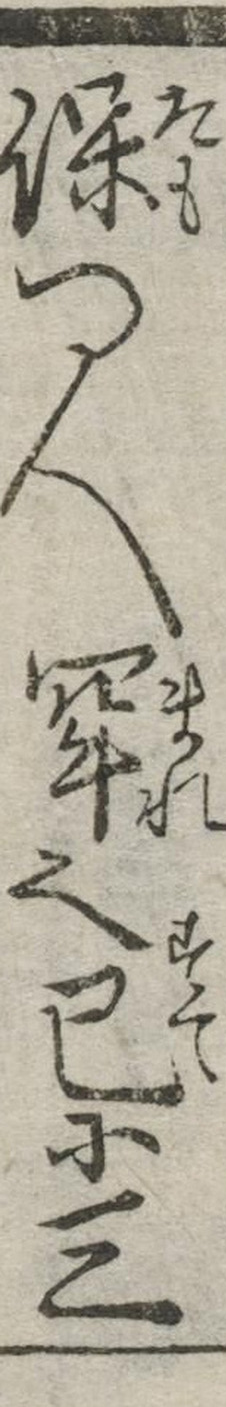保つ人罕也已に三
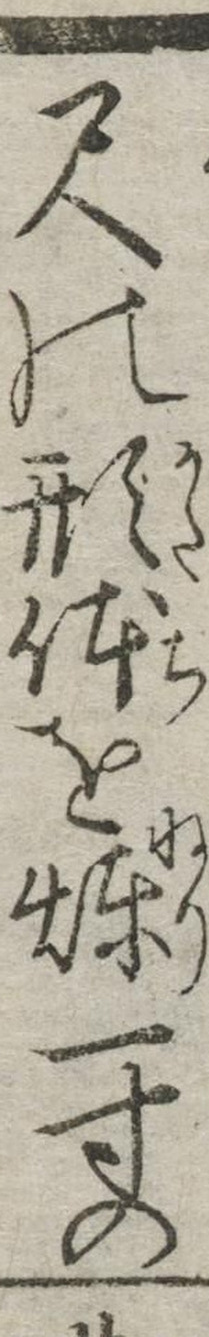尺の形体を煉一寸の
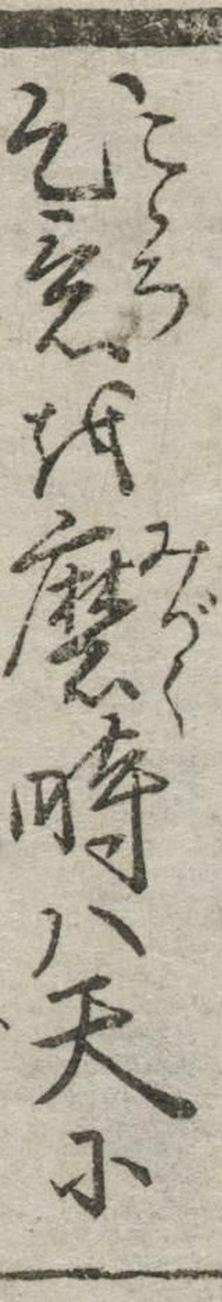心意を磨時は天に
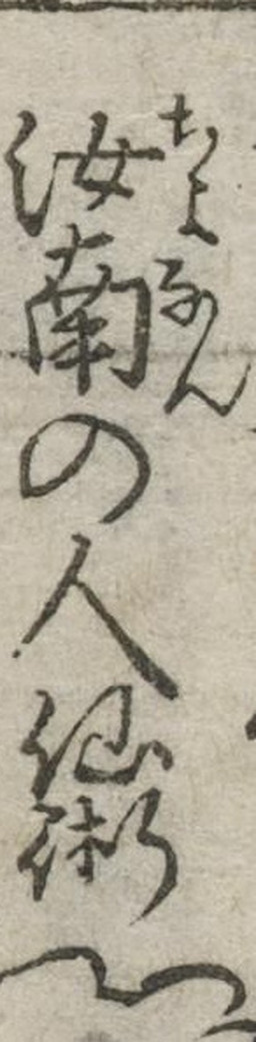汝南の人仙術
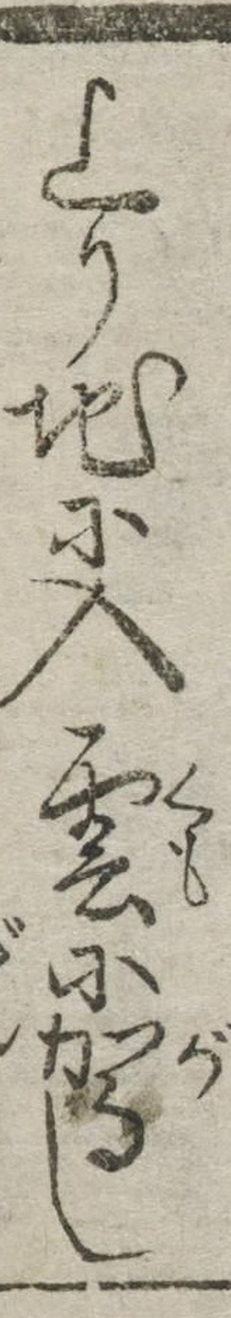上り地に入雲に駕し
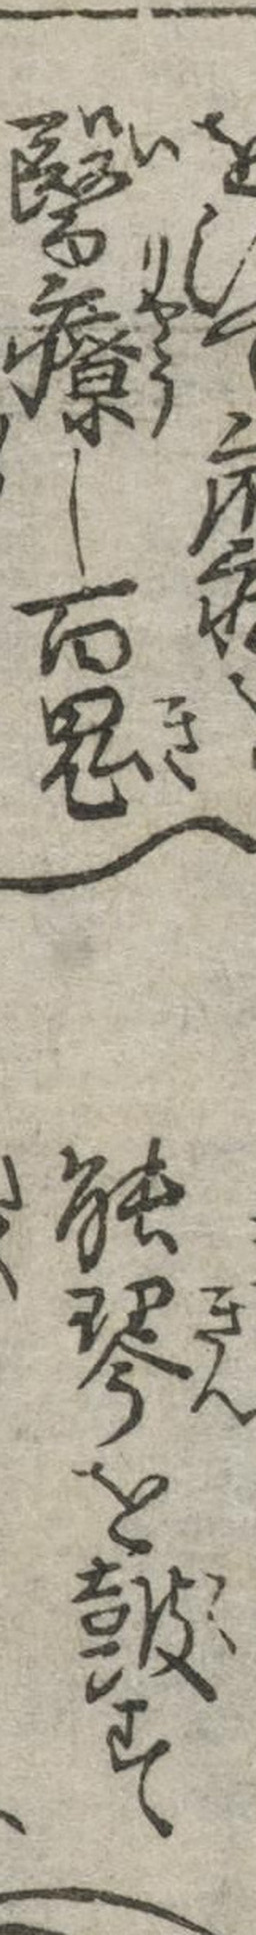能琴を皷す
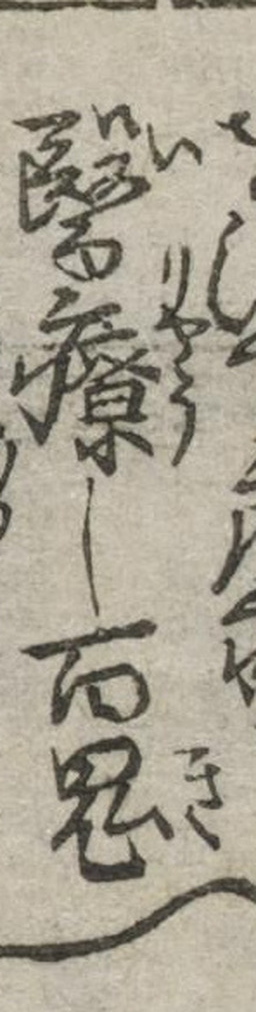医療し百鬼
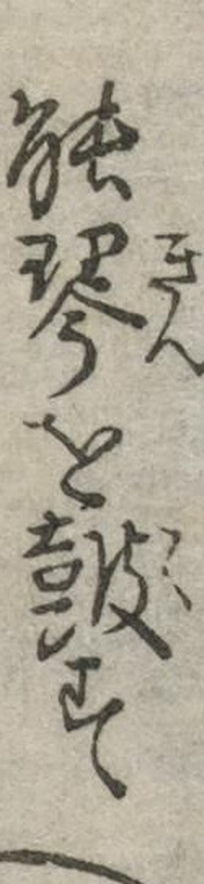能琴を皷す
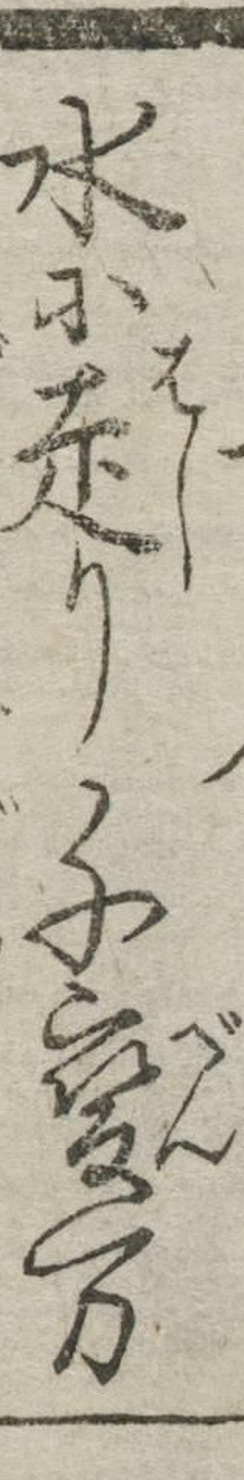水に走り千変万
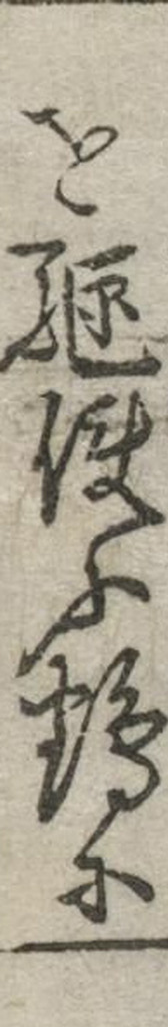を駆使ふ鶴に
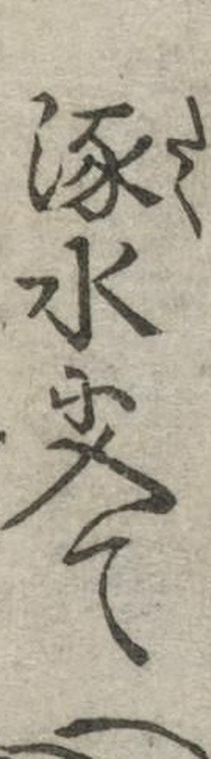涿水に入て
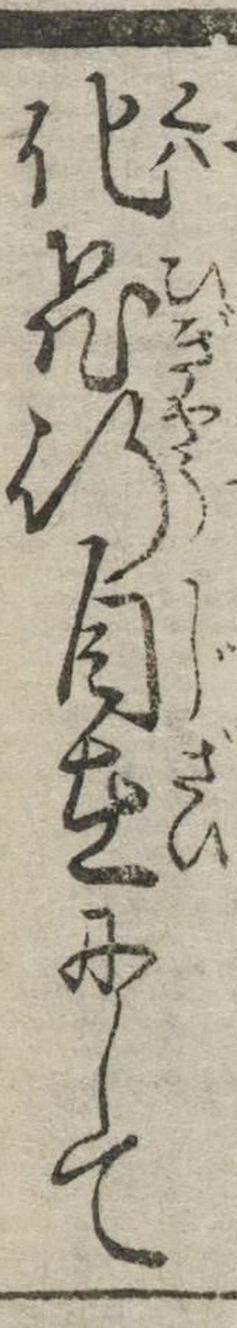化飛行自在にして
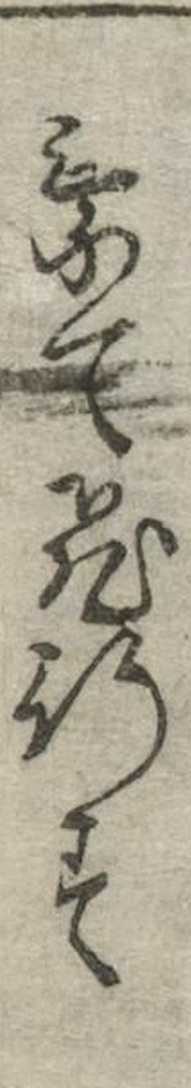乗て飛行す
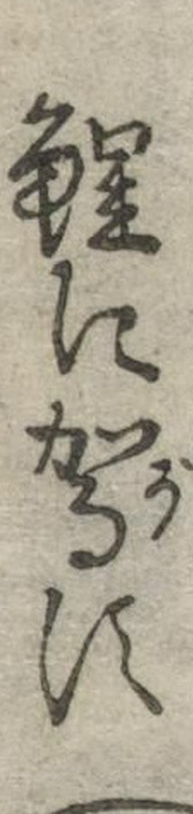鯉に駕す
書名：訓蒙天地辨　人
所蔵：東京大学地震研究所図書室 Earthquake Research Institute Library, The University of Tokyo, JAPAN
